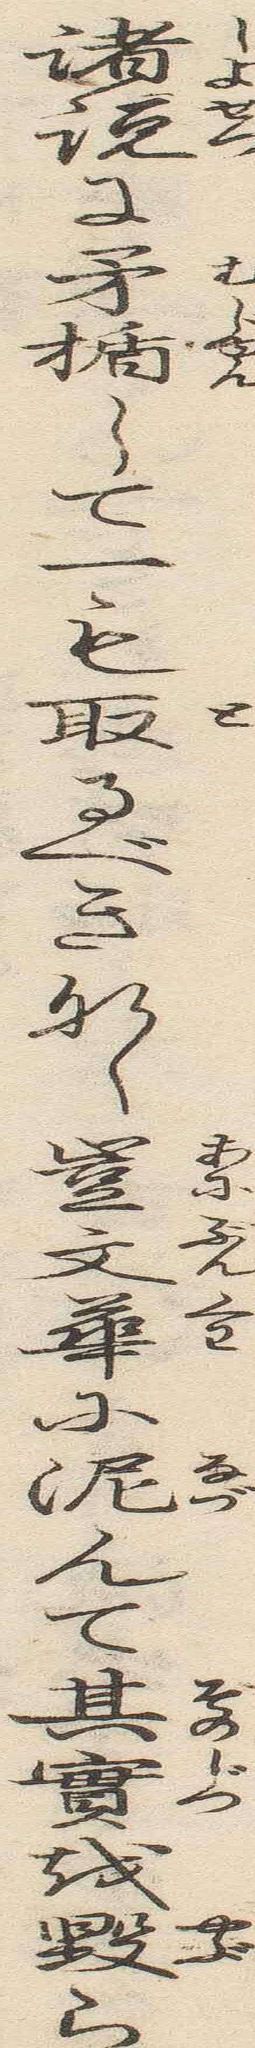諸説に矛楯して一も取るべきなし豈文華に泥んて其實を毀ら
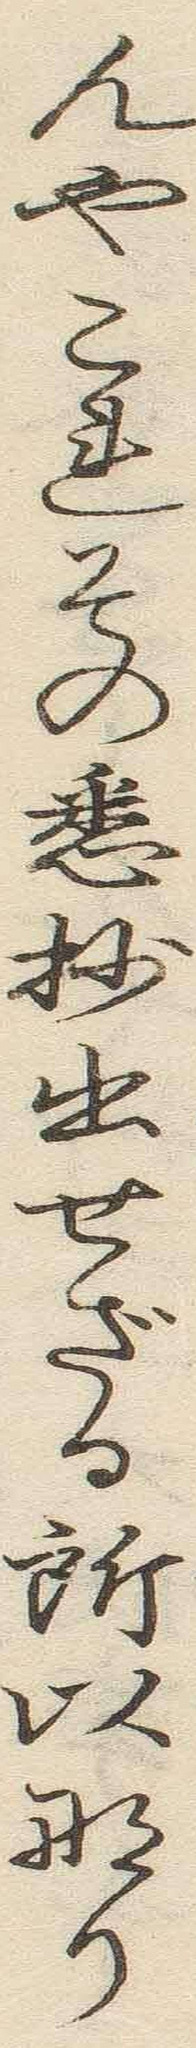んやこれその悉抄出せざる所以なり
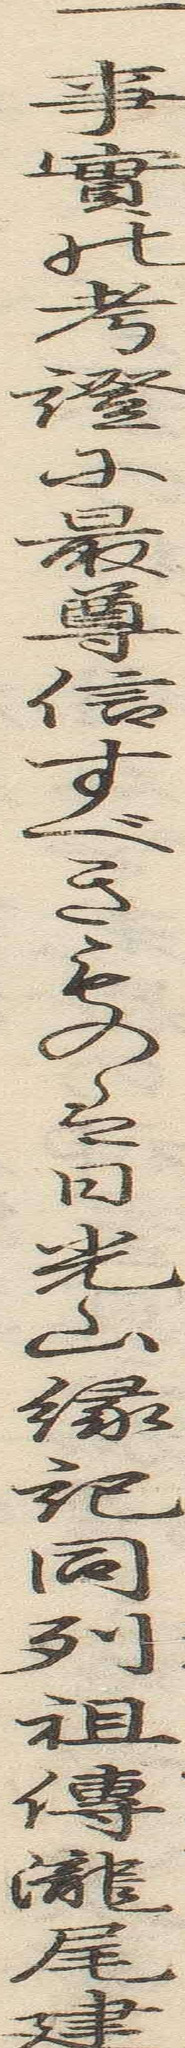一事實の考證に最尊信すべきものは日光山縁記同列祖傳瀧尾建
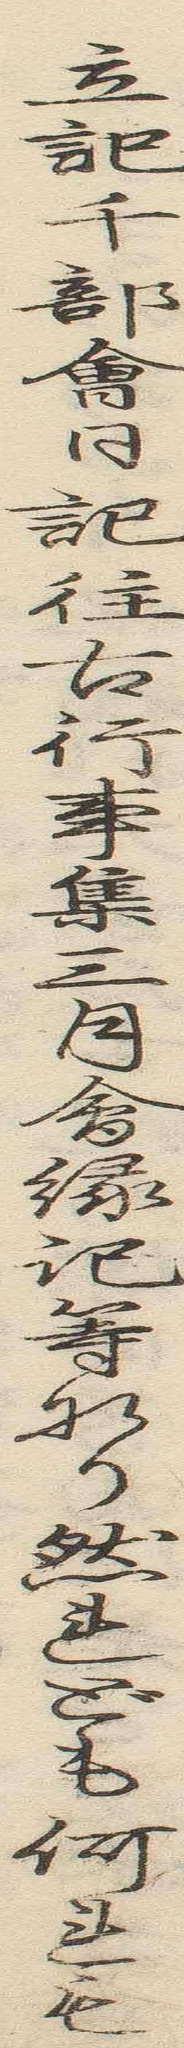立記千部會日記往古行事集三月會縁記等なり然れども何れも
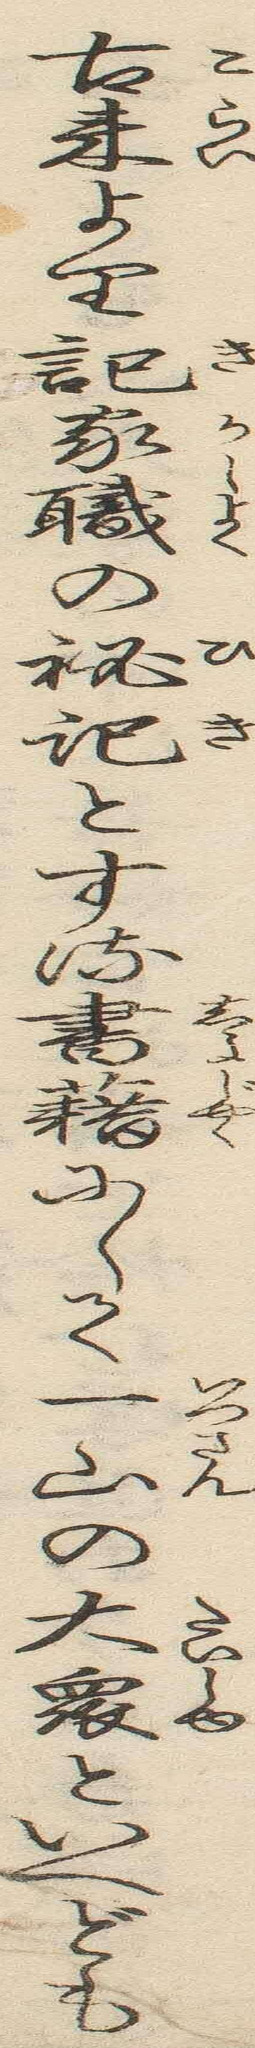古来より記家職の秘記とする書籍にして一山の大衆といへども
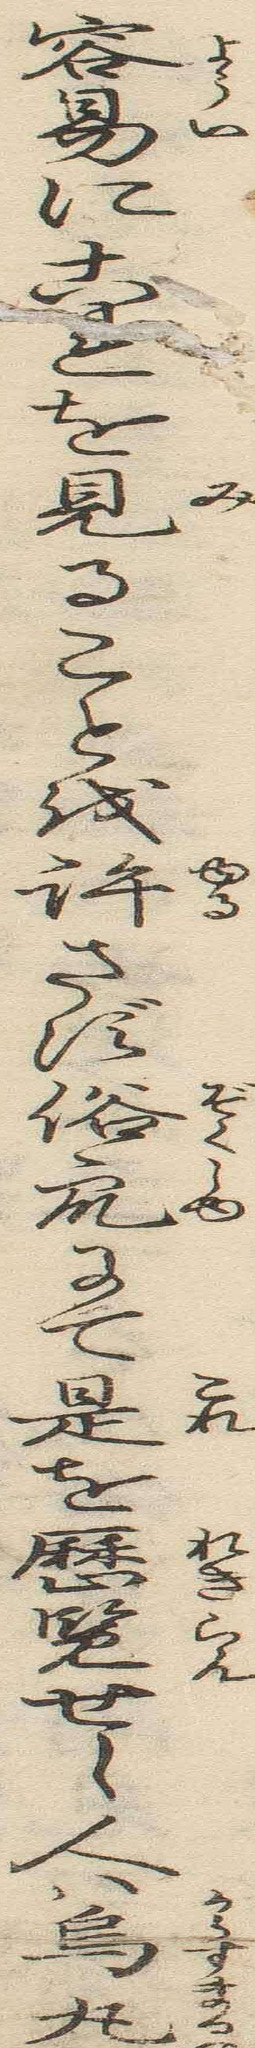容易にこれを見ることを許さず俗衆にて是を歷覧せし人は烏丸
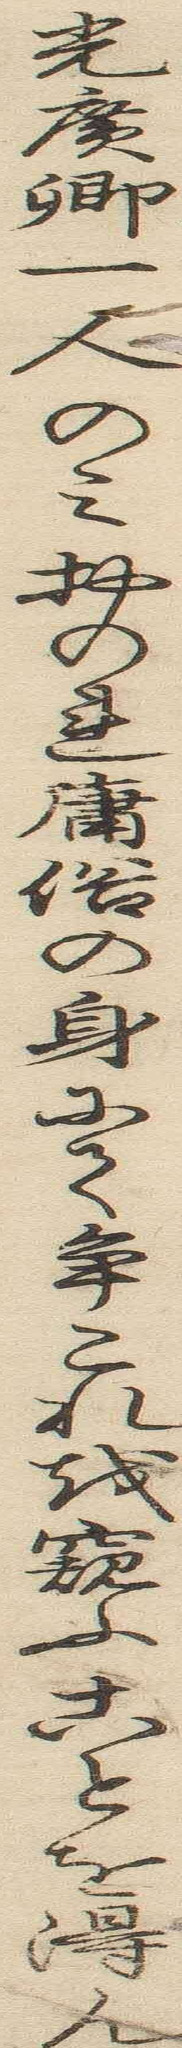光廣卿一人のみおのれ庸俗の身にて争これを窺ふことを得ん

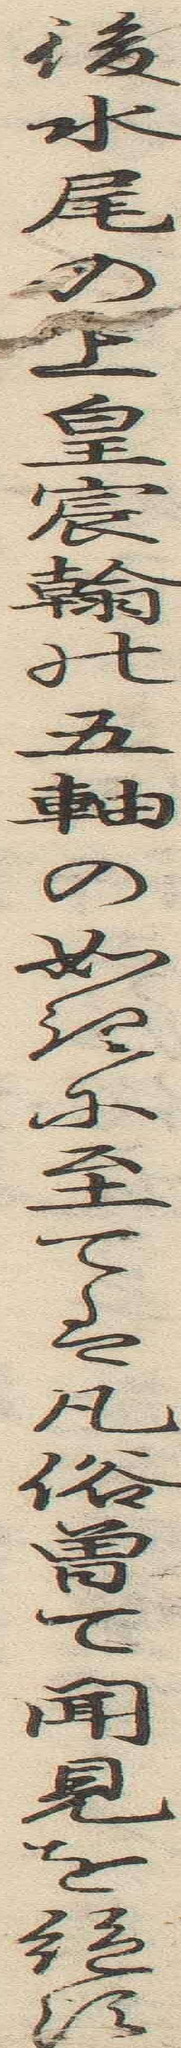後水尾の上皇宸翰の五軸の如きに至ては凡俗曽て聞見を絶す
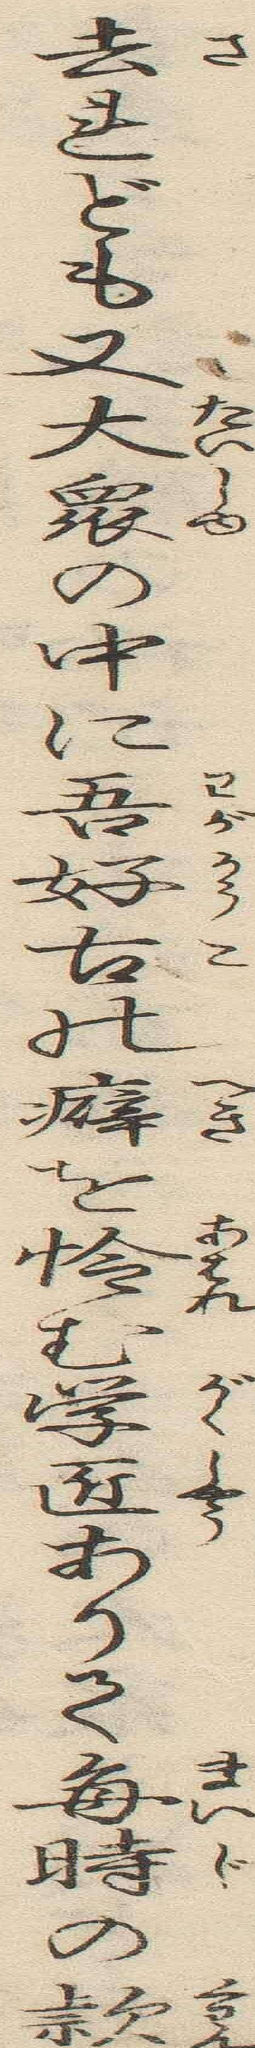去れども又大衆の中に吾好古の癖を怜む学匠ありて毎時の款
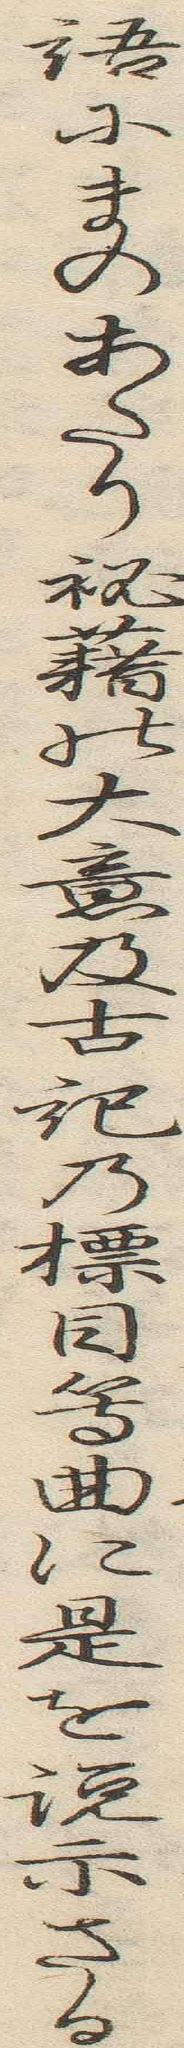語にまのあたり秘籍の大意及古記の標目等曲に是を説示さる
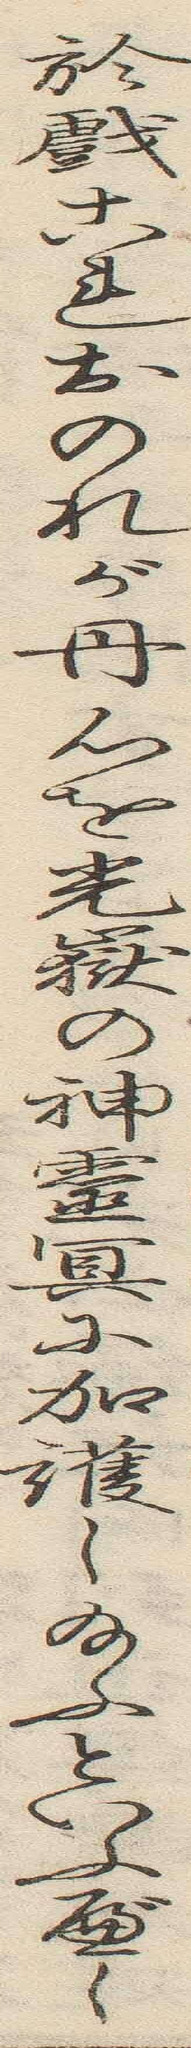於戲これおのれが丹心を光嶽の神靈冥に加護し給ふといふべし
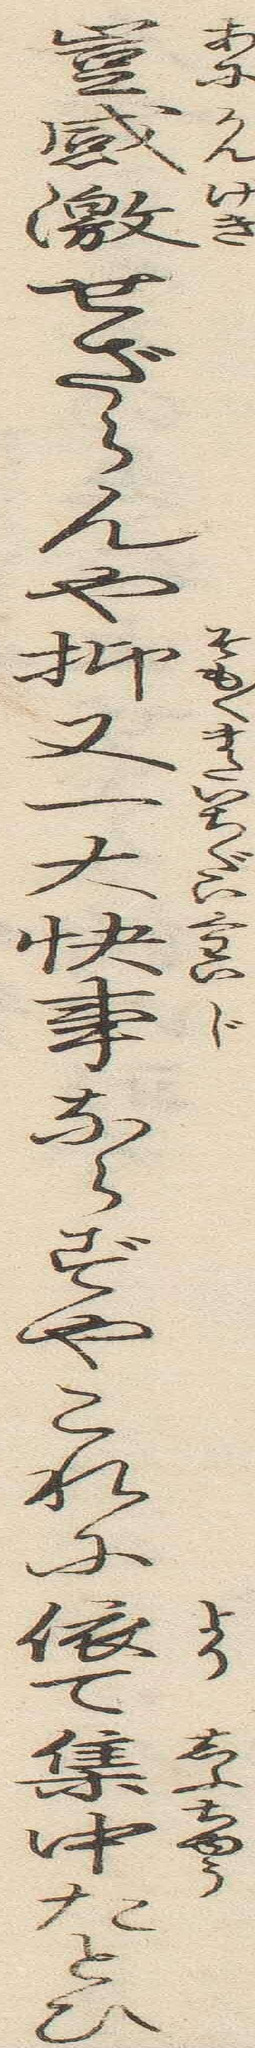豈感激せざらんや抑又一大快事ならずやこれに依て集中たとひ
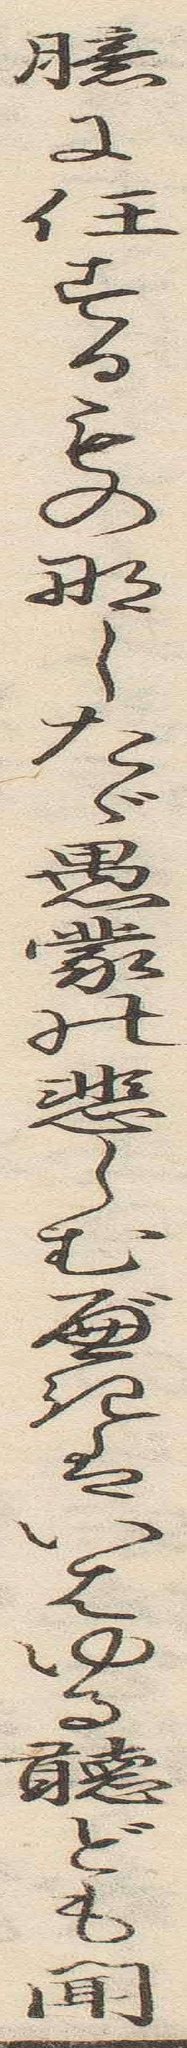臆に任するものなしたゞ愚蒙の悲しむべきはいはゆる聽ども聞
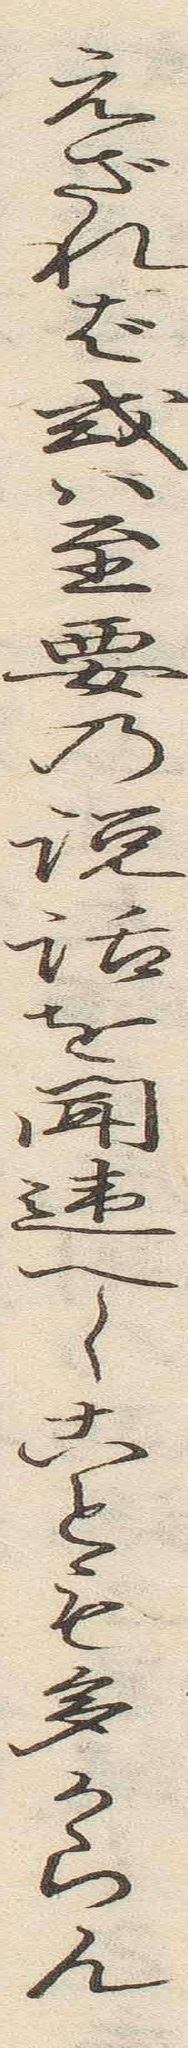えざれば或は至要の説話を聞違へしことも多からん
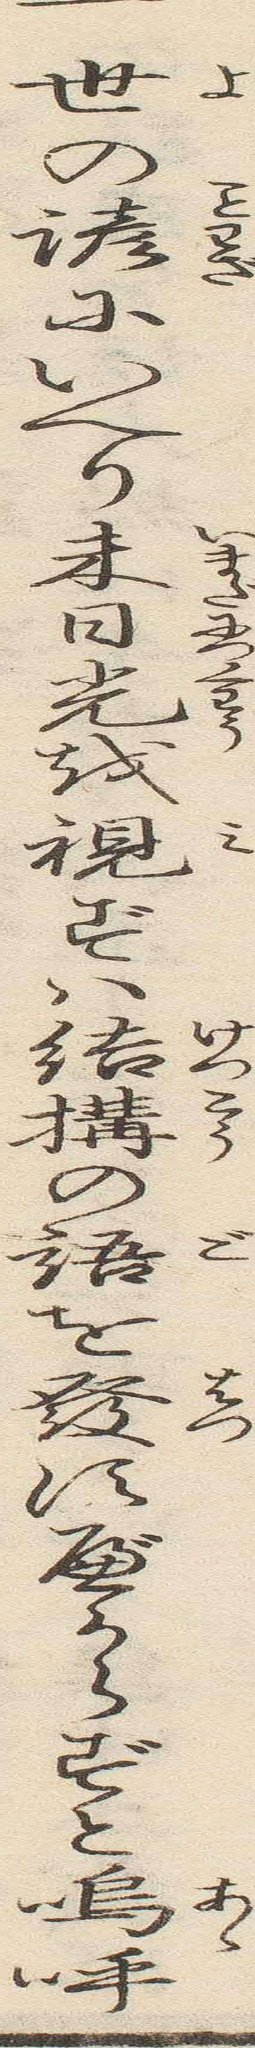一世の諺にいへり未日光を視ずは結構の語を發すべからずと嗚呼
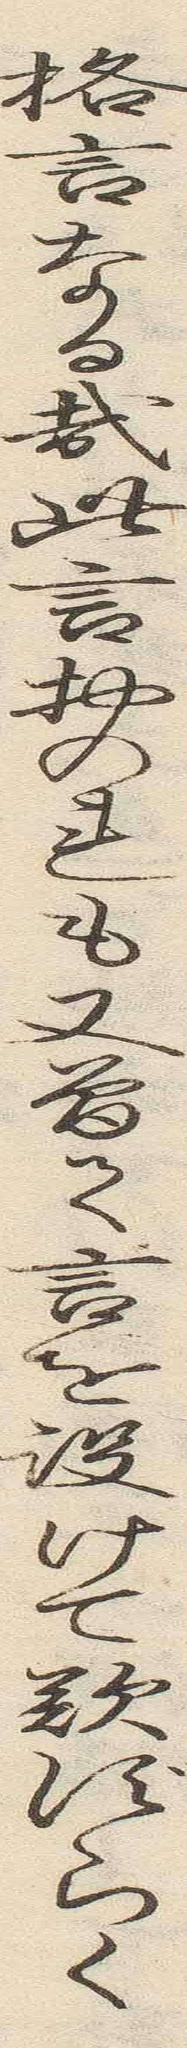格言なる哉此言おのれも又曽て言を設けて歎ずらく
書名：日光山志
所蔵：東京学芸大学附属図書館 国文学研究資料館
